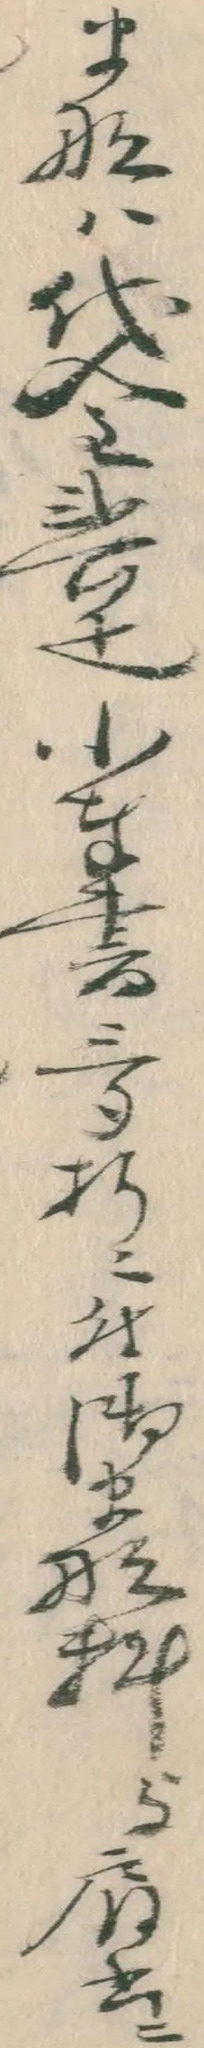まなハ代金弐百疋小奉書三ツ折ニ付御まな料と肩書ニ
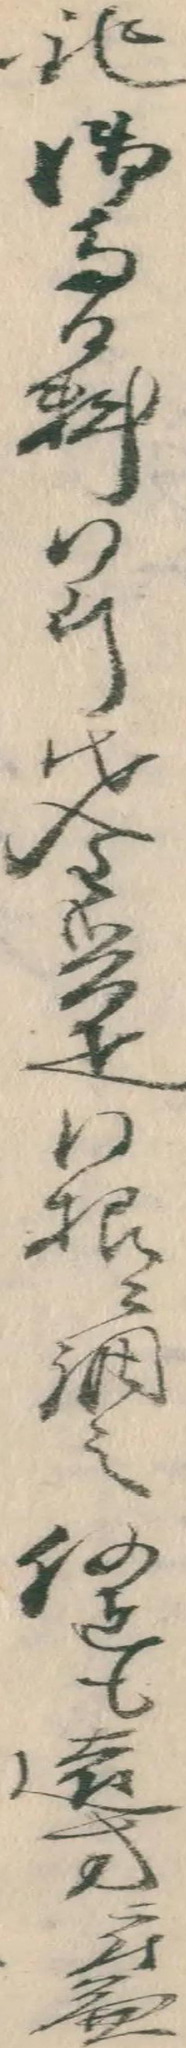記御両日料同所代金弐百疋同様ニ調之何れも遠方ニ付兼
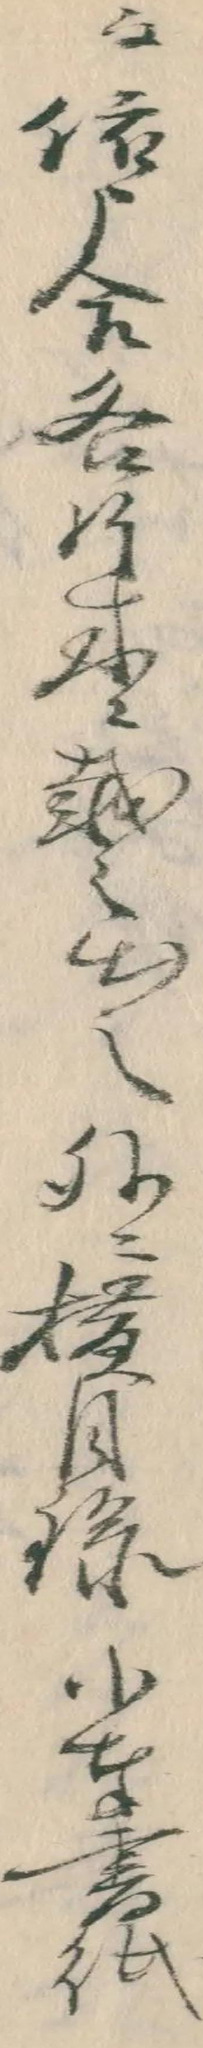而依申合各来ニ越之出也外に横目録小奉書紙
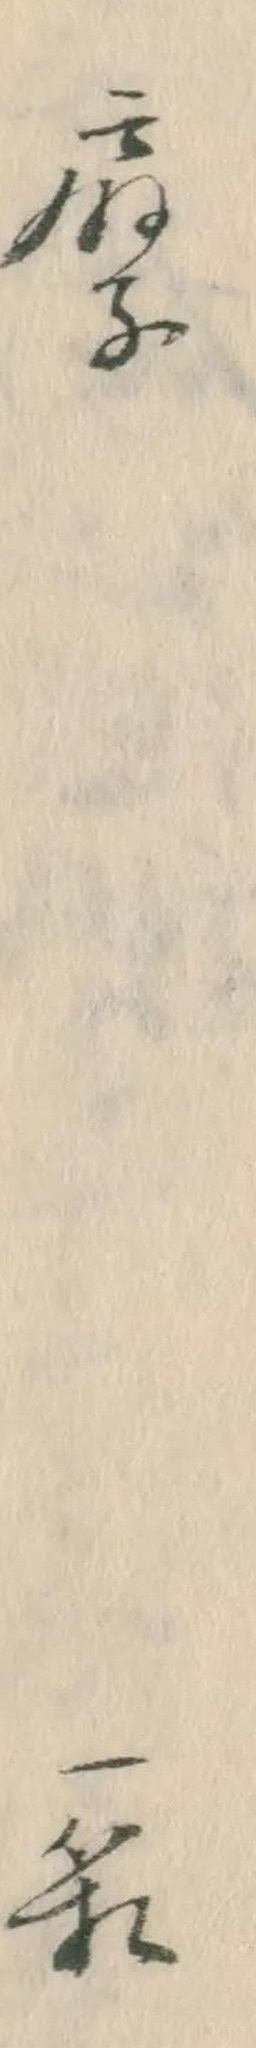扇子一箱
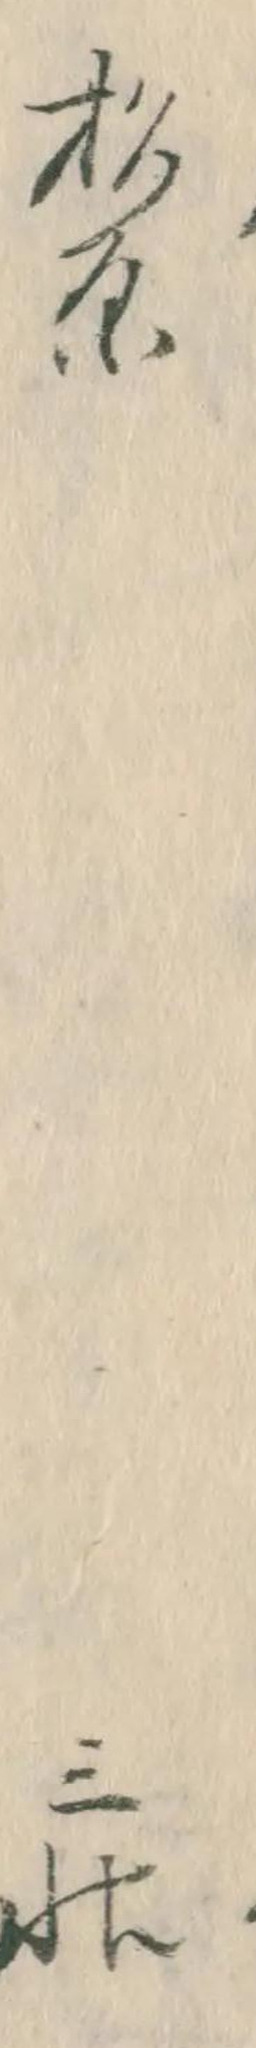杉原三帖
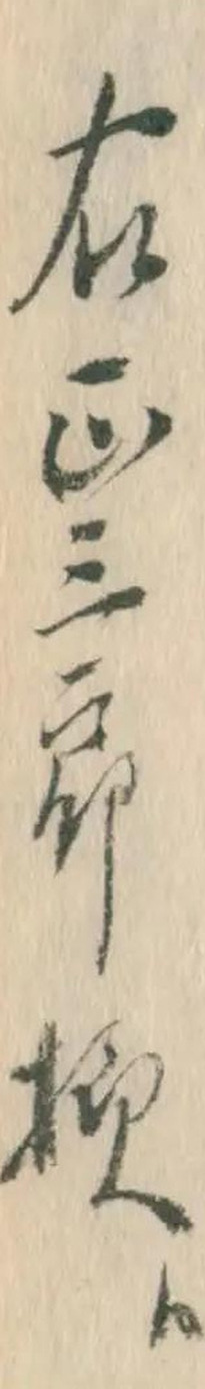右正三郎様え

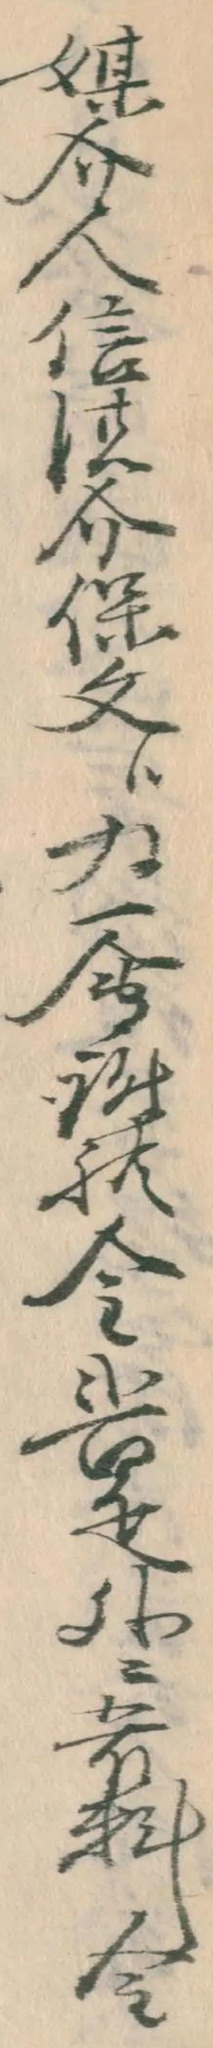媒介人信濃介保文え為一會附扶金弐百疋外ニ肴料金
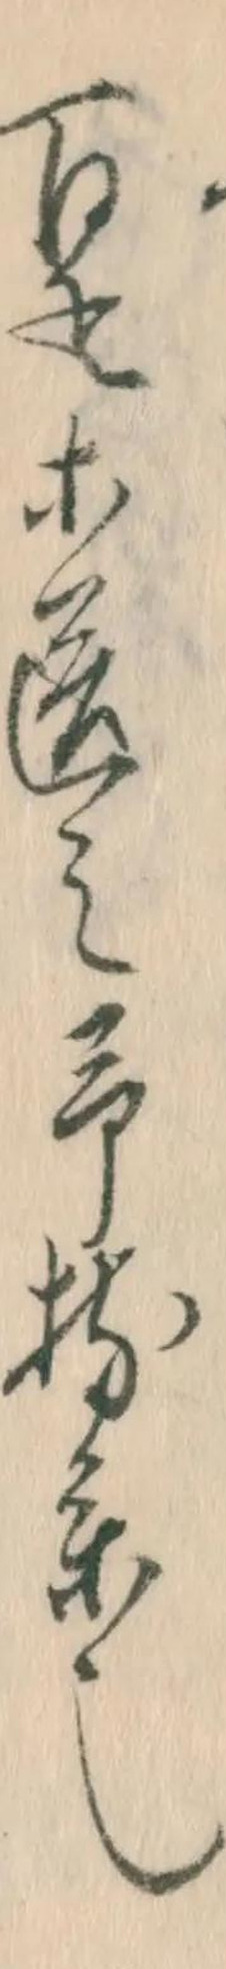百疋等送之予持参也
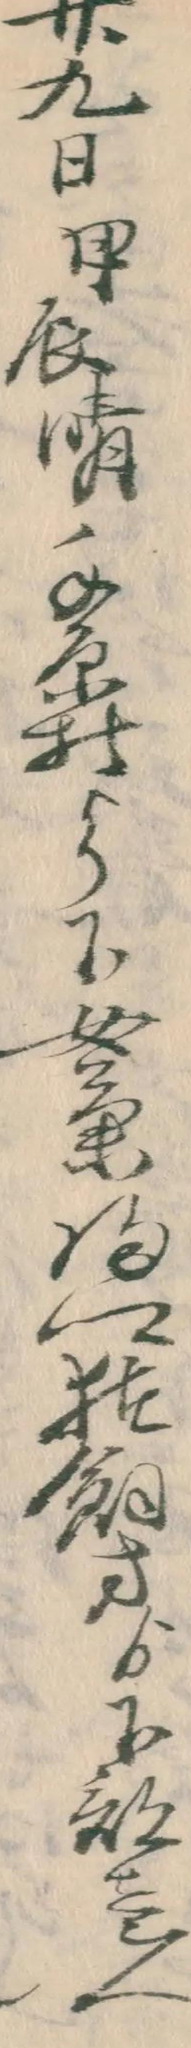廿九日甲辰晴手原村より下女兼帰郷猪飼方ゟ下部壱人
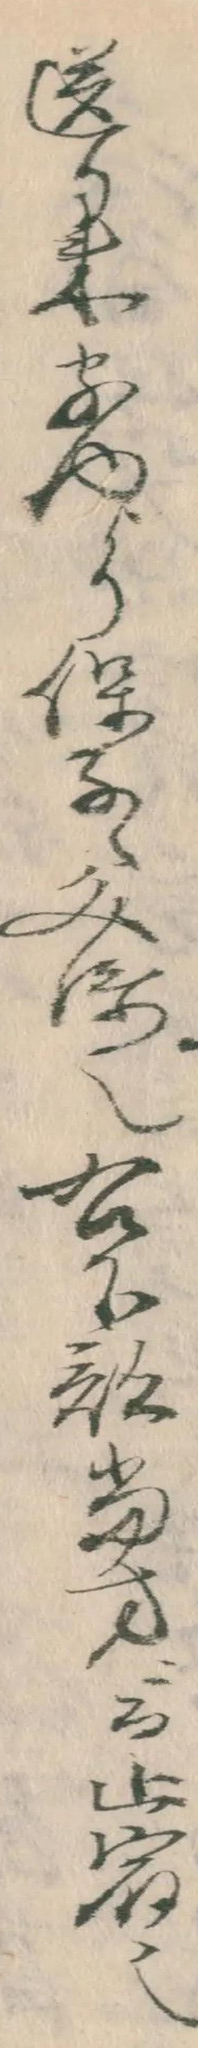送り来家内より保子へ文添也右下部當方ニ而止宿也
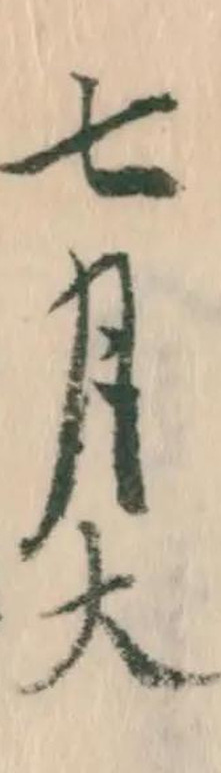七月大
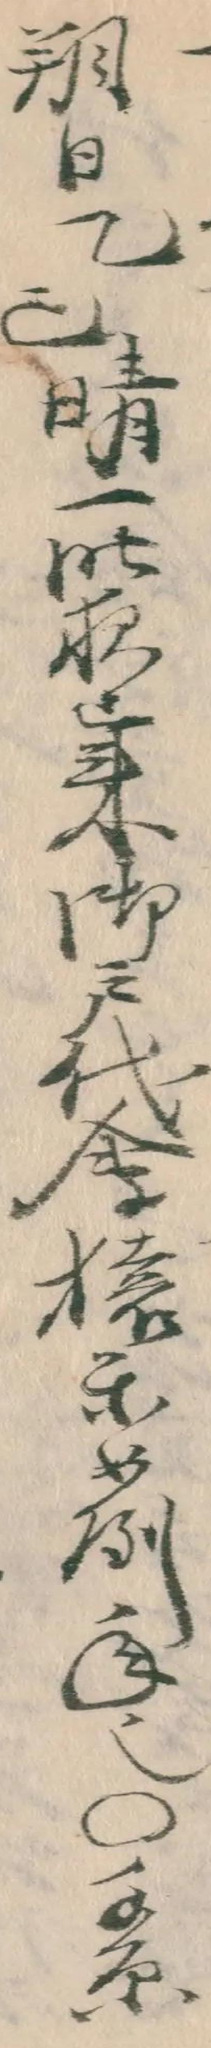朔日乙巳晴一昨夜已来御戸代會猿楽如例年也○手原
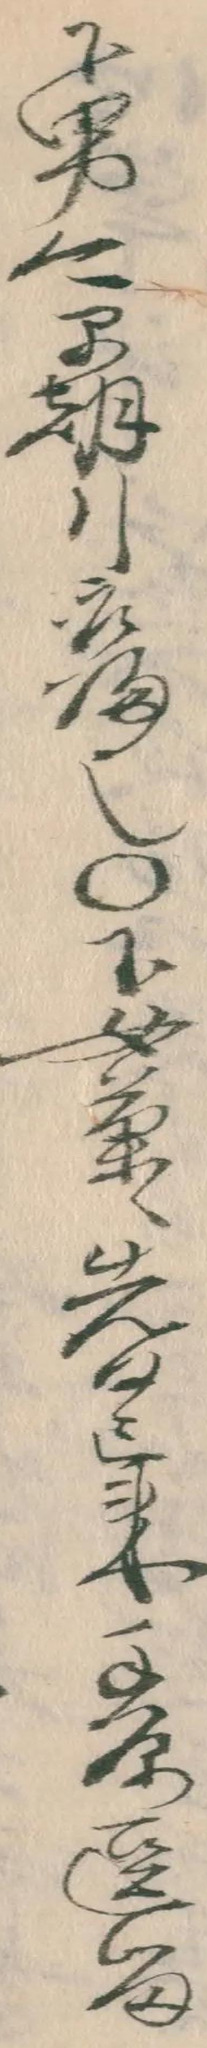下男今早朝引取帰之○下女兼へ先日已来手原逗留
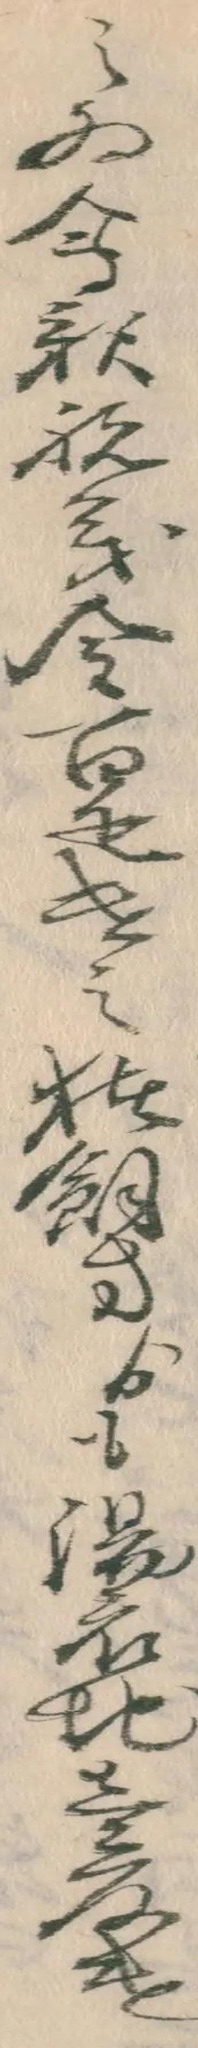之為會釈祝義金百疋遣之猪飼方ゟも湯衣地壱反遣
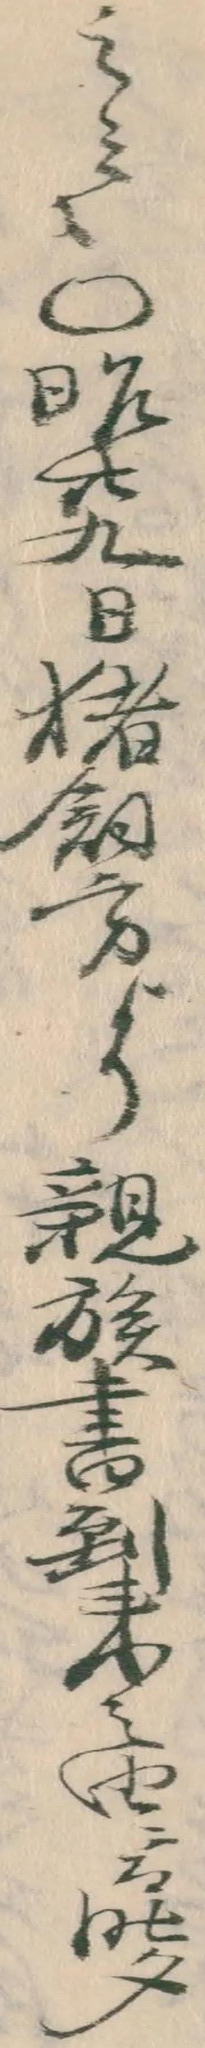之云々○昨廿九日猪飼方より親族書到来之由ニ而昨夕
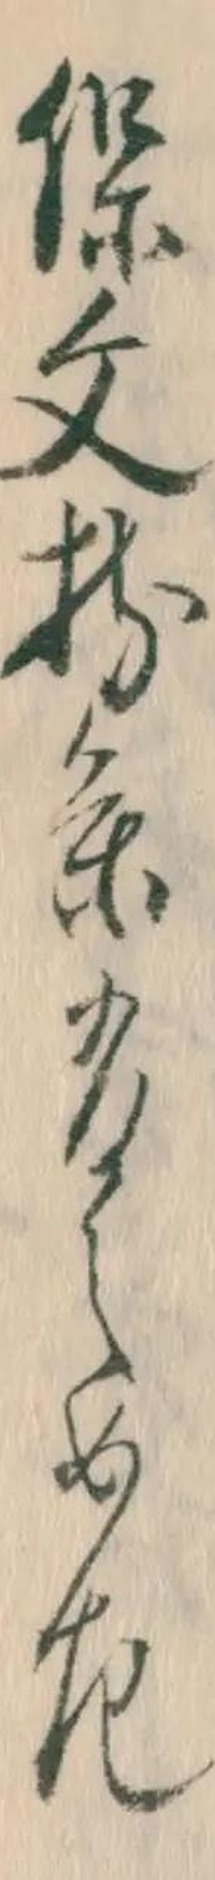保文持参有之如左
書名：賀茂社記録. 第66冊
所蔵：国立国会図書館 National Diet Library, JAPAN
